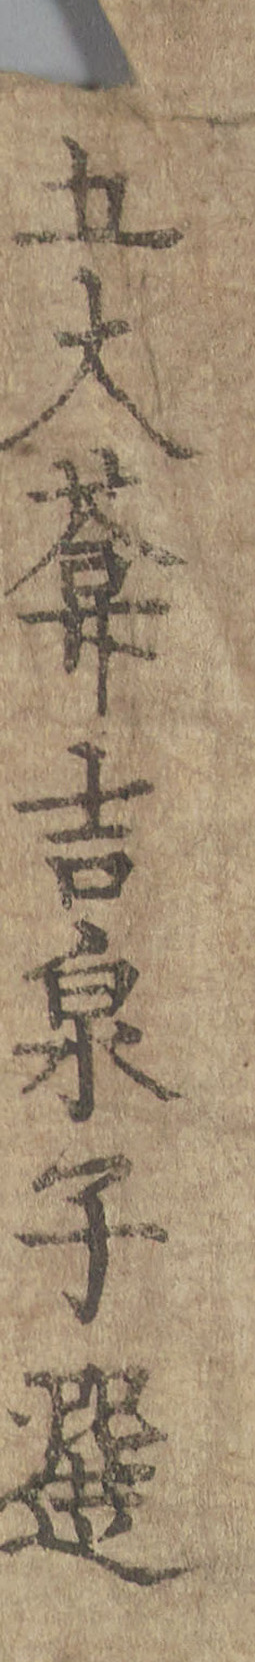五大葊吉泉子選
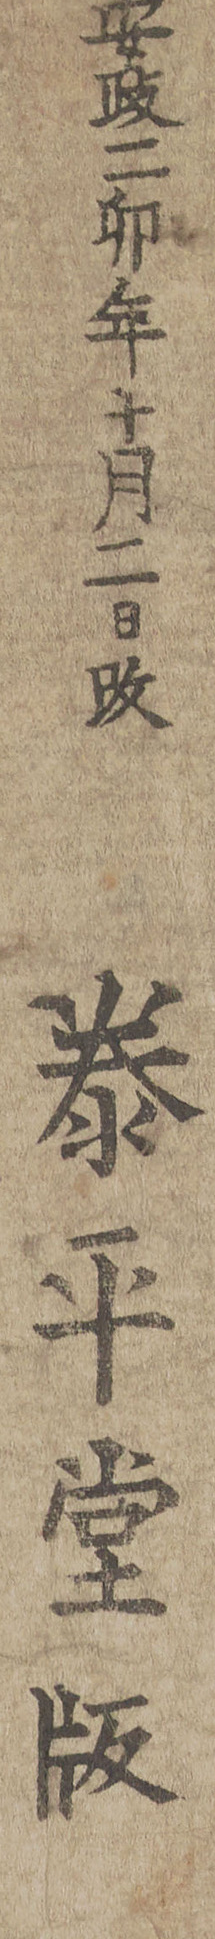安政二卯年十月二日改泰平堂版
